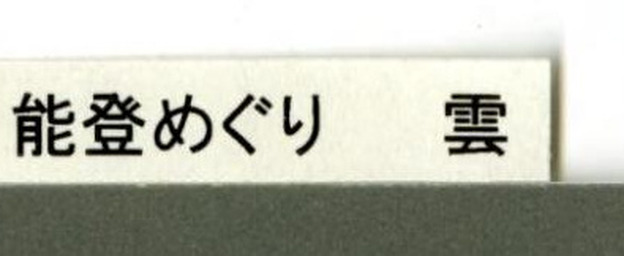能登めくり雲

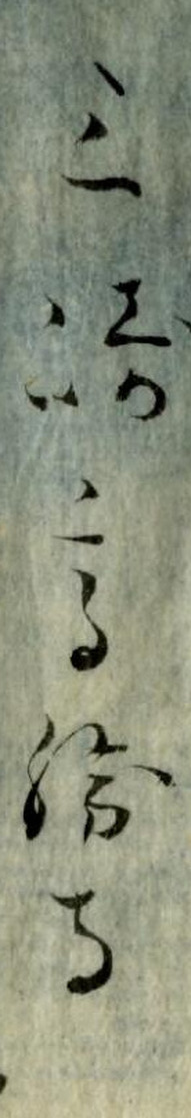三崎高勝寺
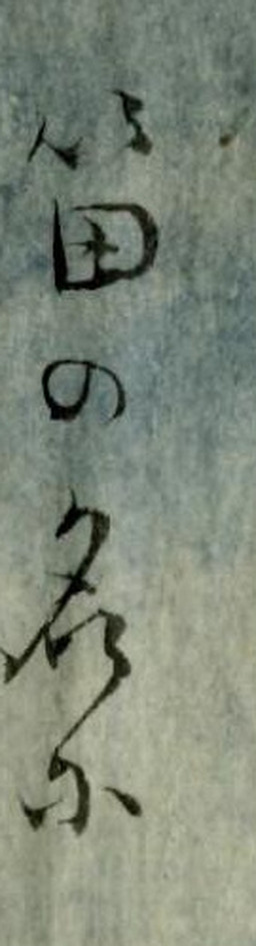笛の名に
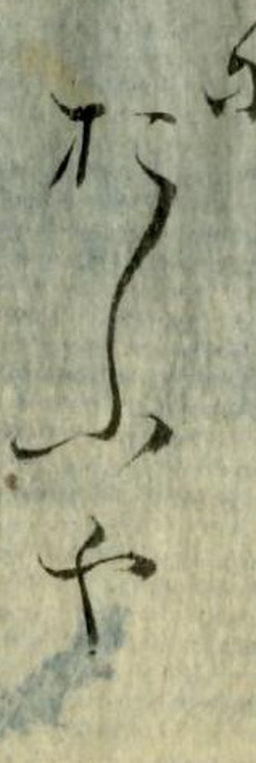おふや
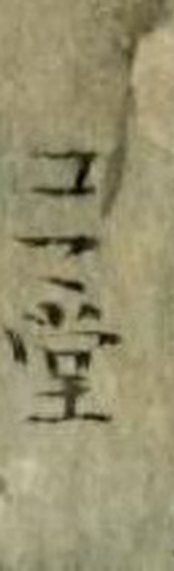コマ堂

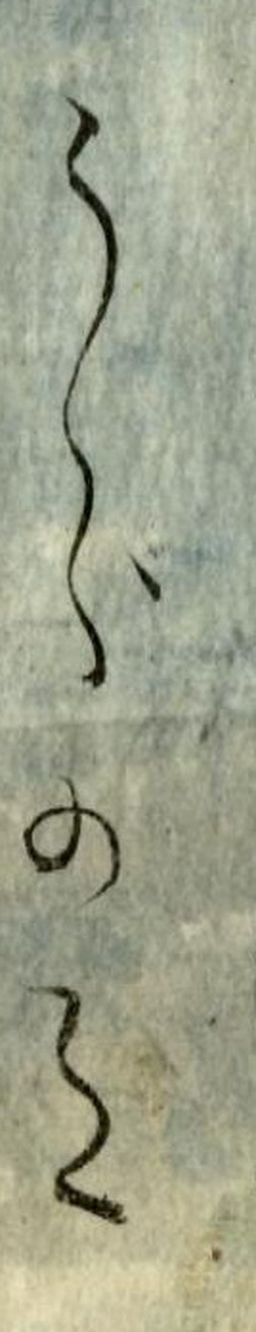うらの月
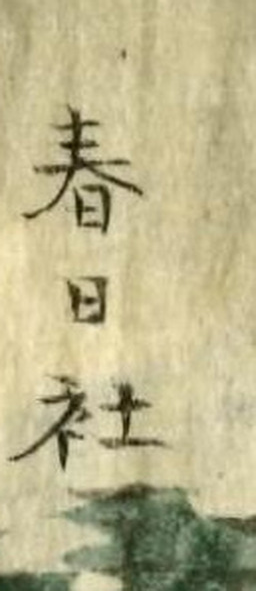春日社
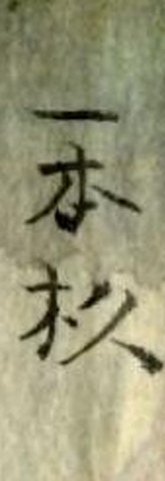一本杦
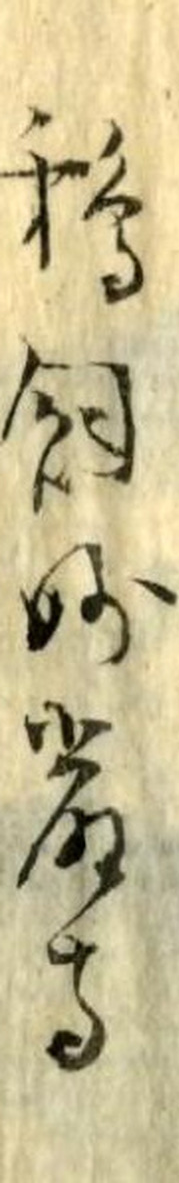鵜飼妙厳寺
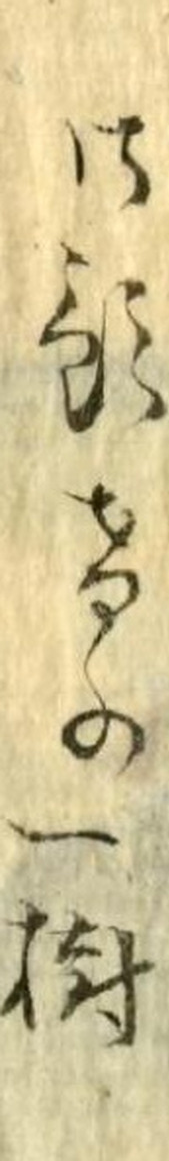御預けの一樹
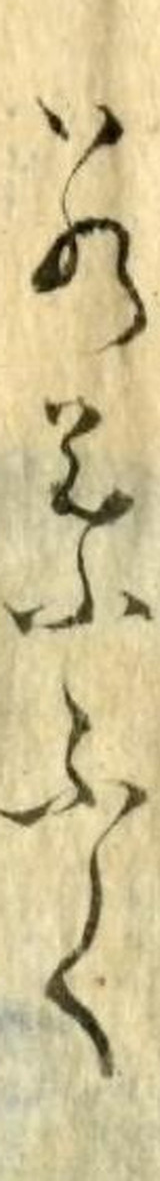若葉ふく
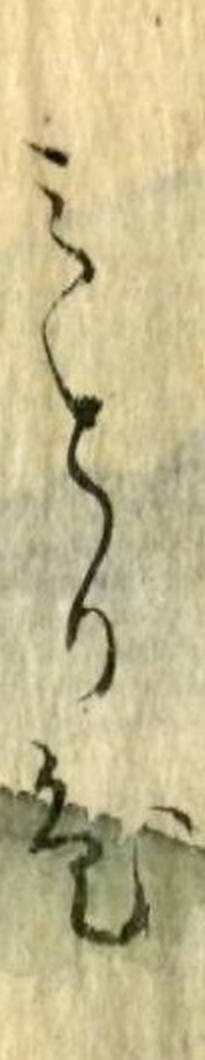みとり色

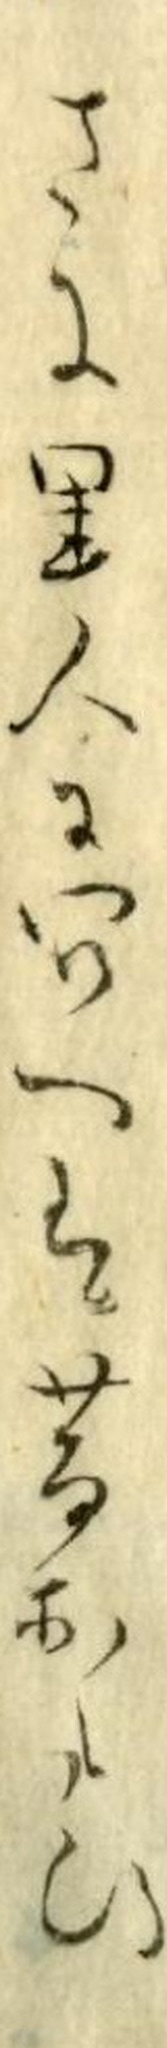さに里人に問へは昔おもひ
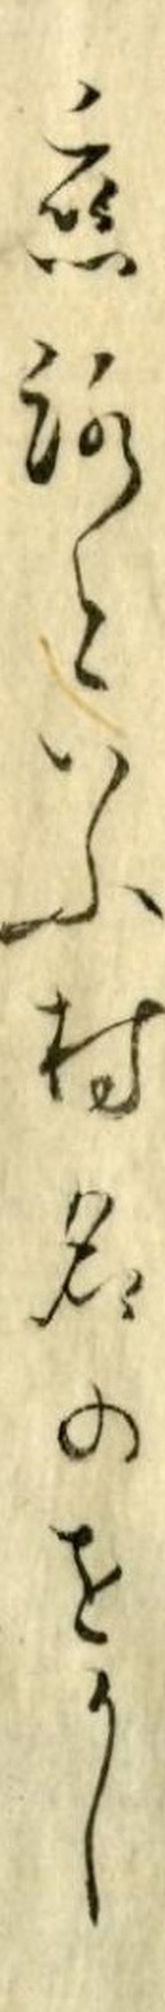恋路といふ村名のをかし
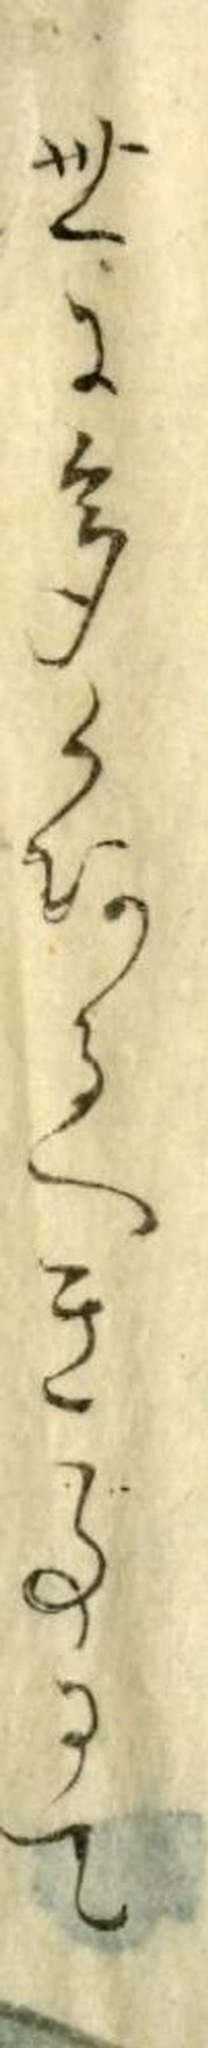世に多くあるへき事にて
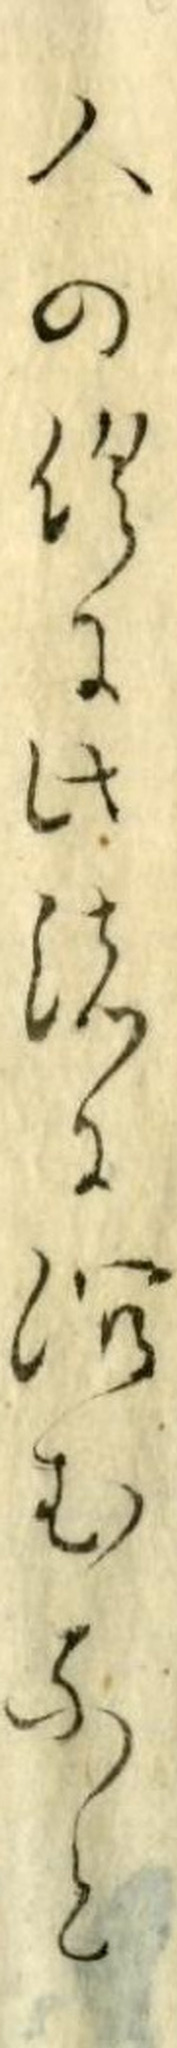人の倶に此渚に沈むなと
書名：能登めぐり
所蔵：Ishikawa Prefectural Library
